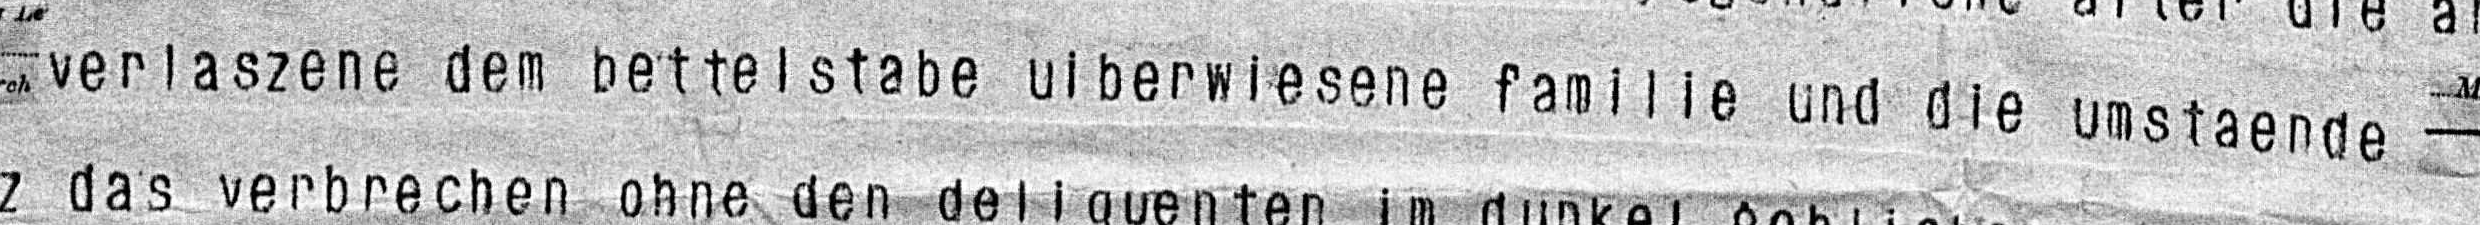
verlaszene dem bettelstabe uiberwiesene familie und die umstaende
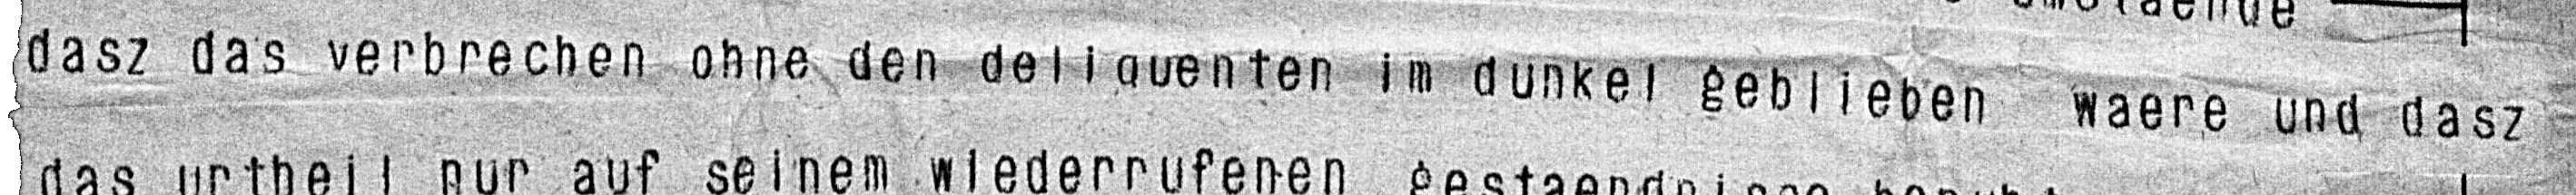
dasz das verbrechen ohne den deliquenten im dunkel geblieben waere und dasz
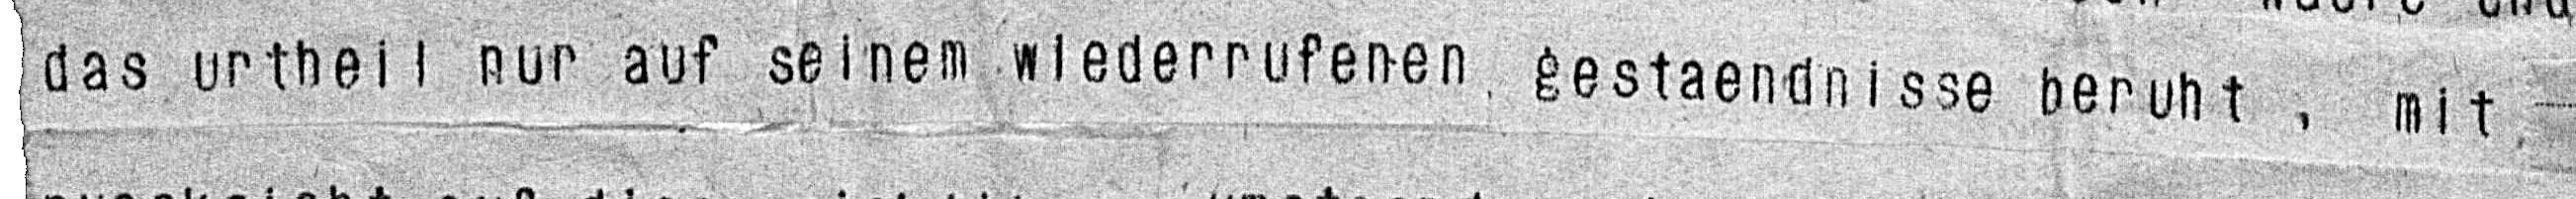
das urtheil nur auf seinem wiederrufenen gestaendnisse beruht, mit
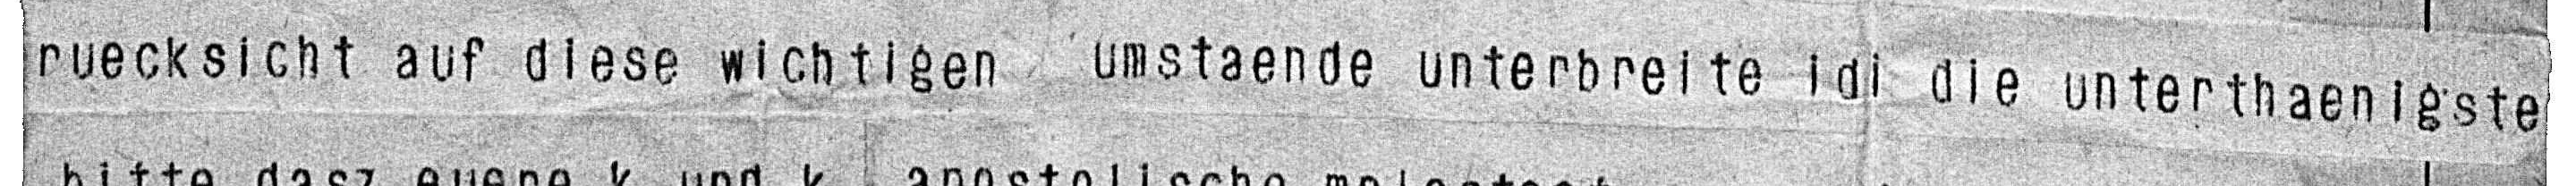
ruecksicht auf diese wichtigen umstaende unterbreite idi [sic – must be „ich“] die unterthaenigste
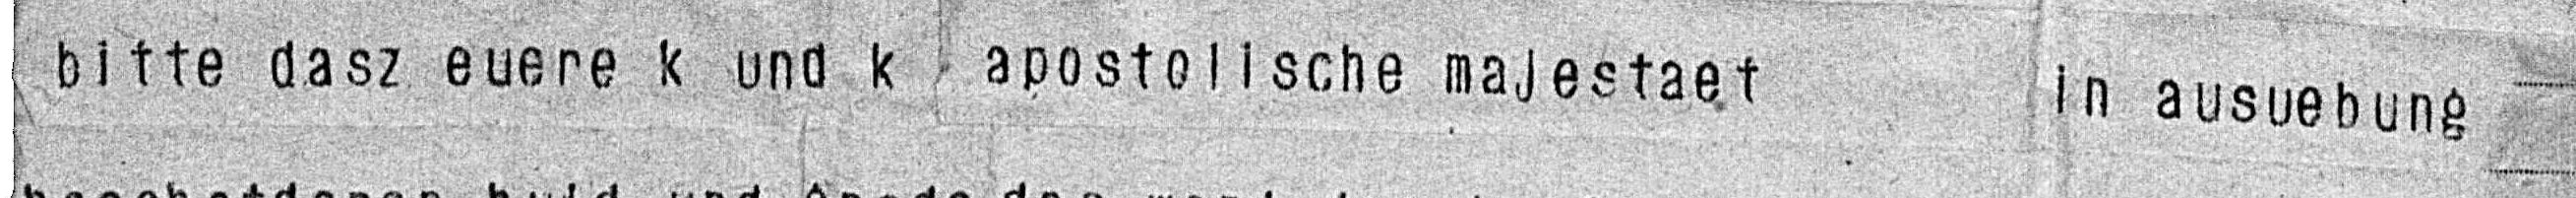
bitte dasz euere k und k apostolische majestaet in ausuebung
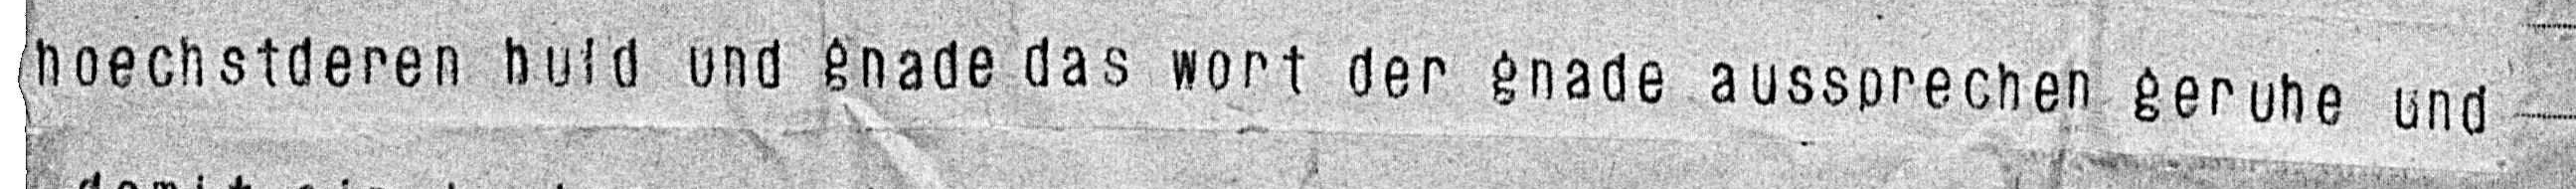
hoechstderen huld und gnade das wort der gnade aussprechen geruhe und
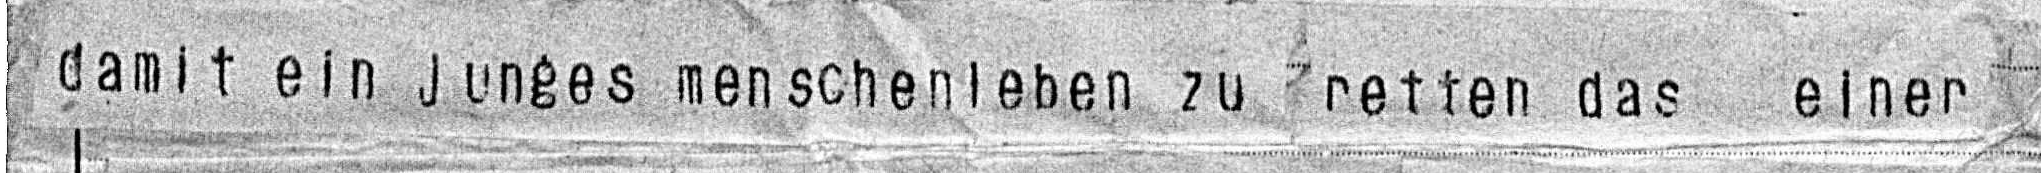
damit ein Junges menschenleben zu retten das einer
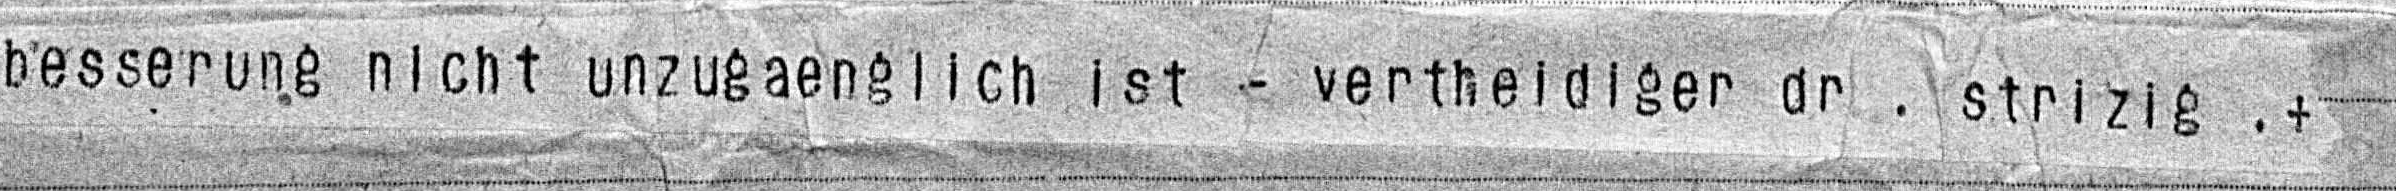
besserung nicht unzugaenglich ist - vertheidiger dr. strizig.+
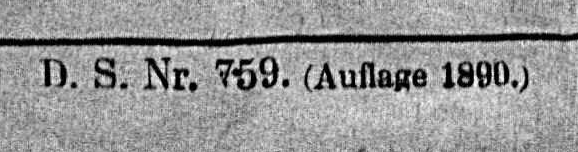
D. S. Nr. 759. (Auflage 1890.)
